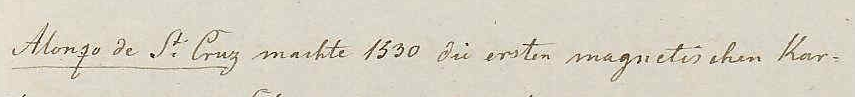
Alonzo de St Cruz machte 1530 die ersten magnetischen Kar-
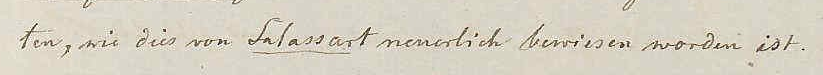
ten, wie dies von Salassart neuerlich bewiesen worden ist.
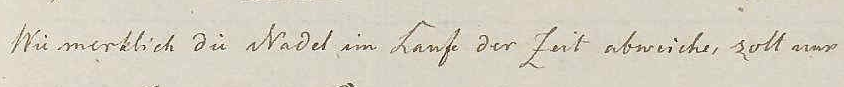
Wie merklich die Nadel im Laufe der Zeit abweiche, soll uns
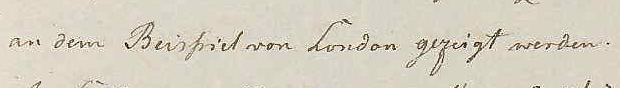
an dem Beispiel von London gezeigt werden.
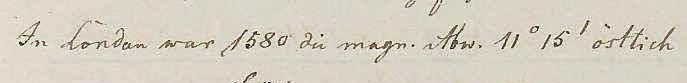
In London war 1580 die magn. Abw. 11° 15′ östlich
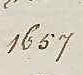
1657
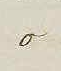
1665
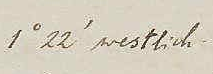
1° 22′ westlich
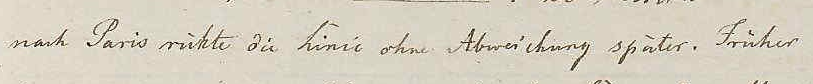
nach Paris rükte die Linie ohne Abweichung später. Früher
